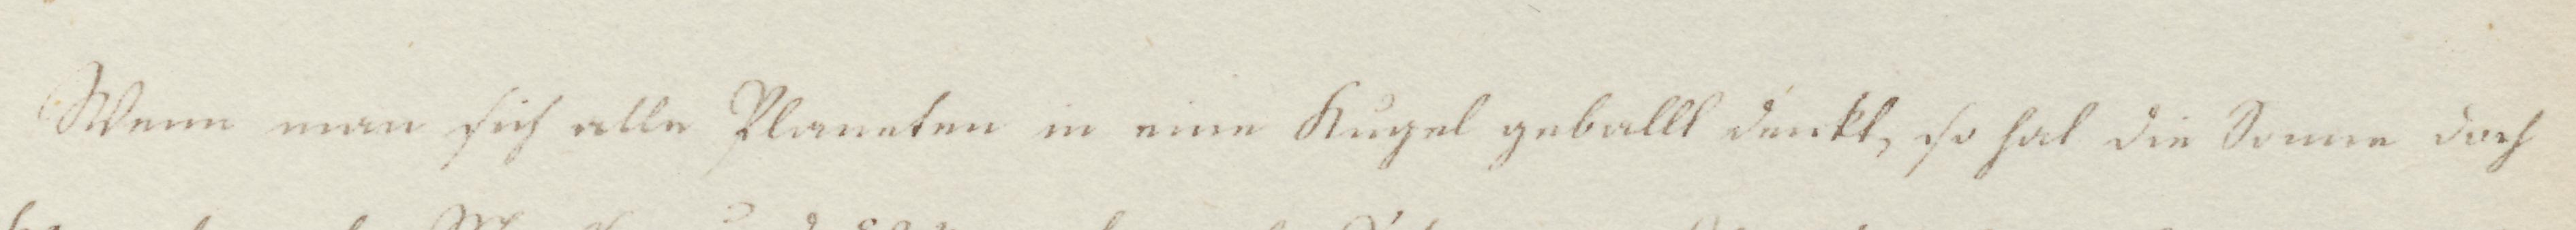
Wenn man sich alle Planeten in eine Kugel geballt denkt, so hat die Sonne doch
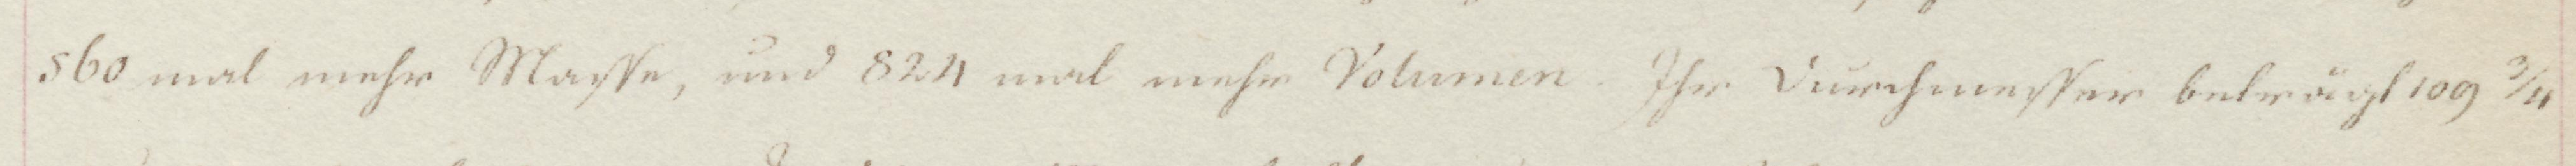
560 mal mehr Masse, und 824 mal mehr Volumen. Ihr Durchmesser beträgt 109¾
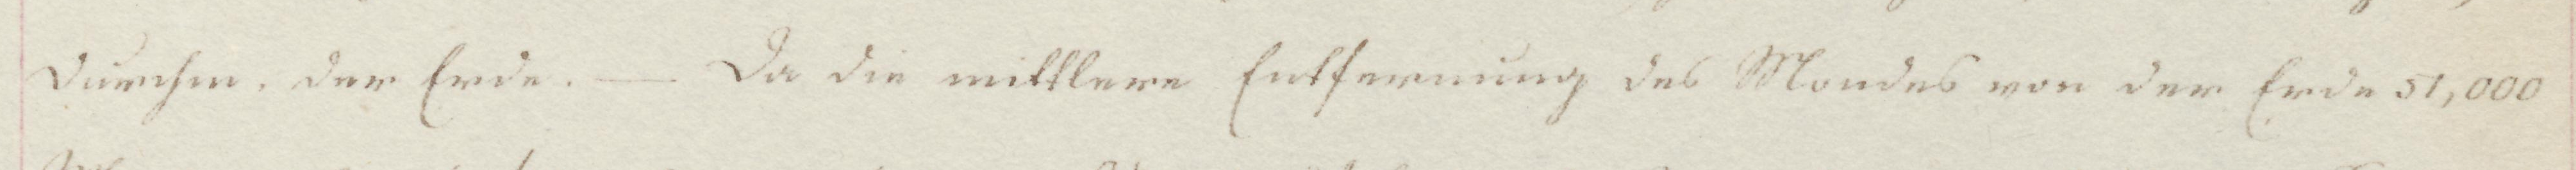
Durchm. der Erde. – Da die mittlere Entfernung des Mondes von der Erde 51,000
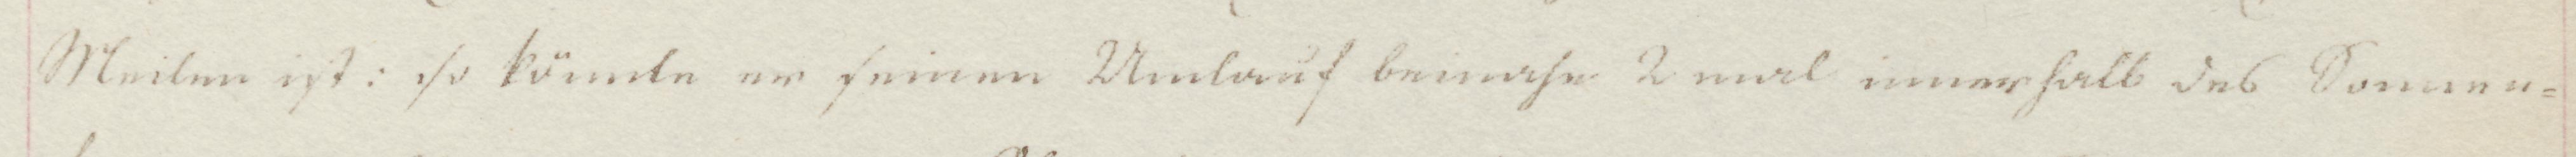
Meilen ist: so könnte er seinen Umlauf beinahe 2 mal innerhalb des Sonnen-
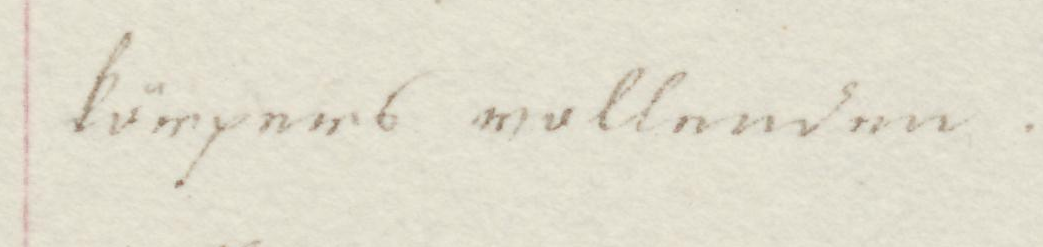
körpers vollenden. –
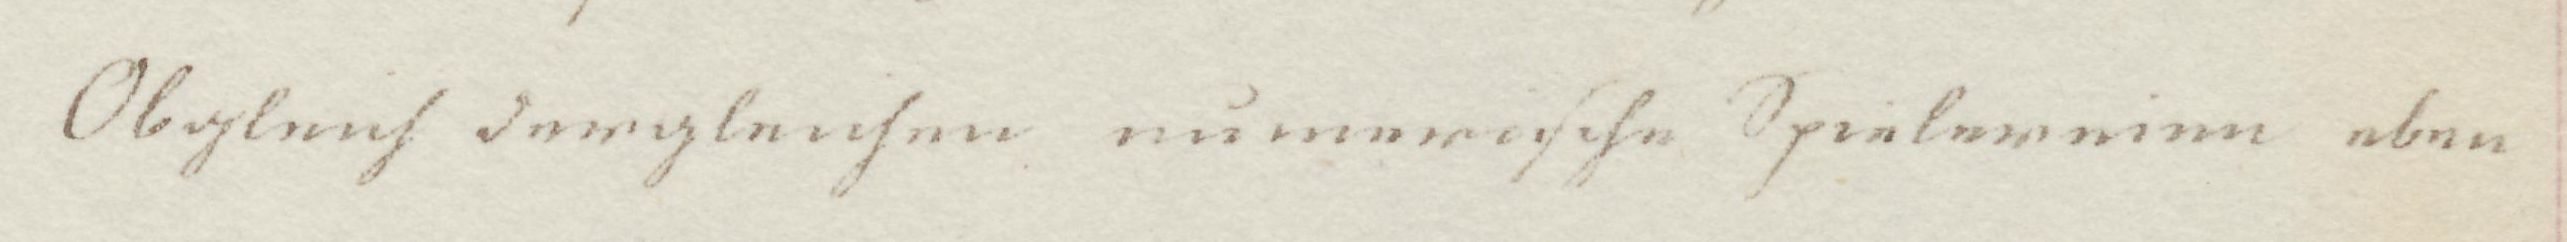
Obgleich dergleichen numerische Spielereien eben
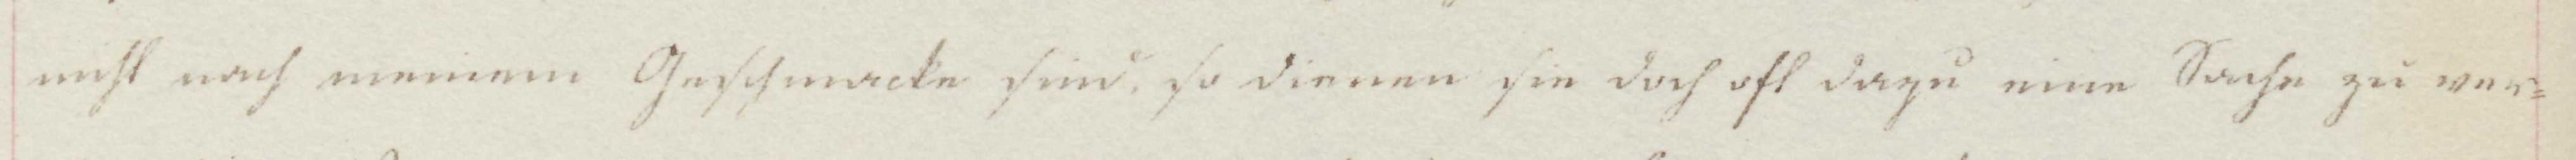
nicht nach meinem Geschmacke sind, so dienen sie doch oft dazu eine Sache zu ver-
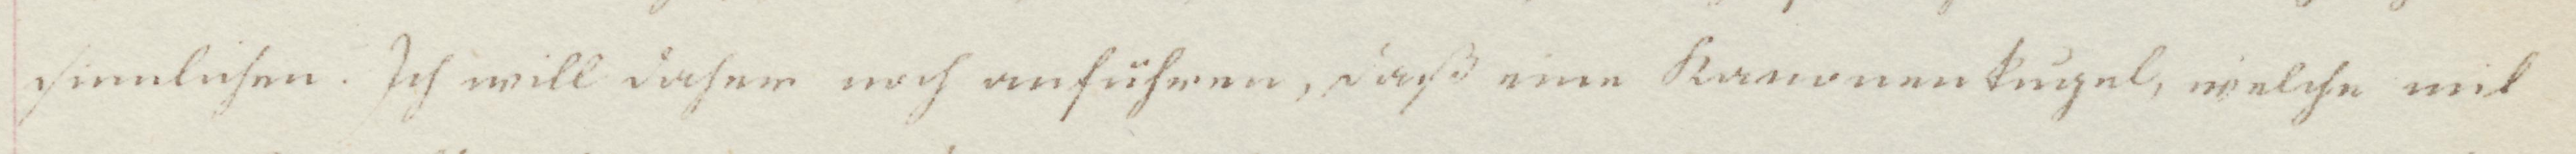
sinnlichen. Ich will daher noch anführen, daß eine Kanonenkugel, welche mit
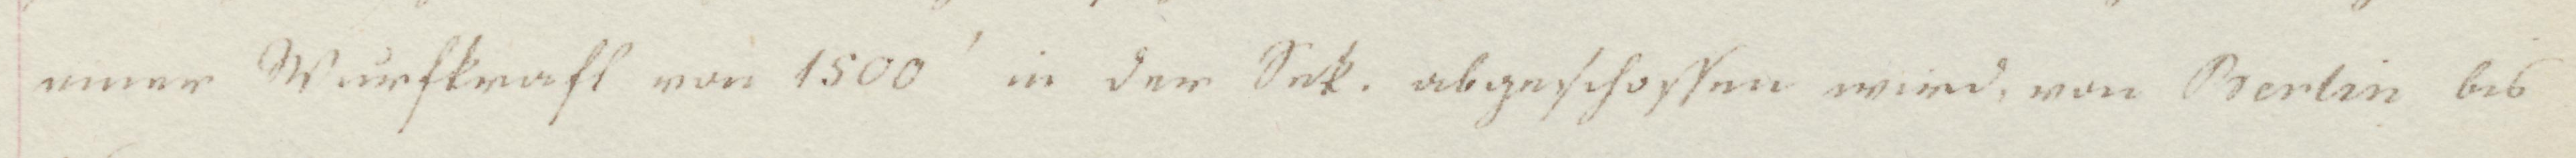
einer Wurfkraft von 1500′ in der Sek. abgeschossen wird, von Berlin bis
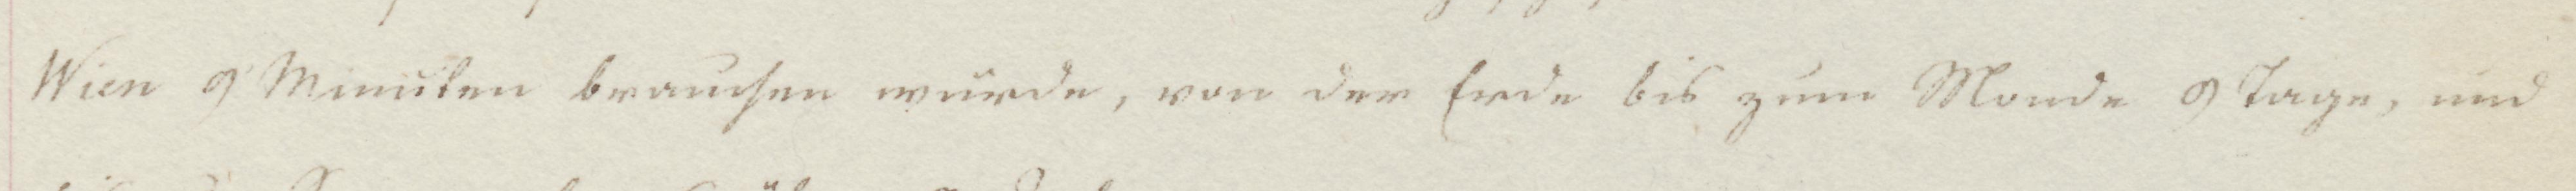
Wien 9 Minuten brauchen würde, von der Erde bis zum Monde 9 Tage, und
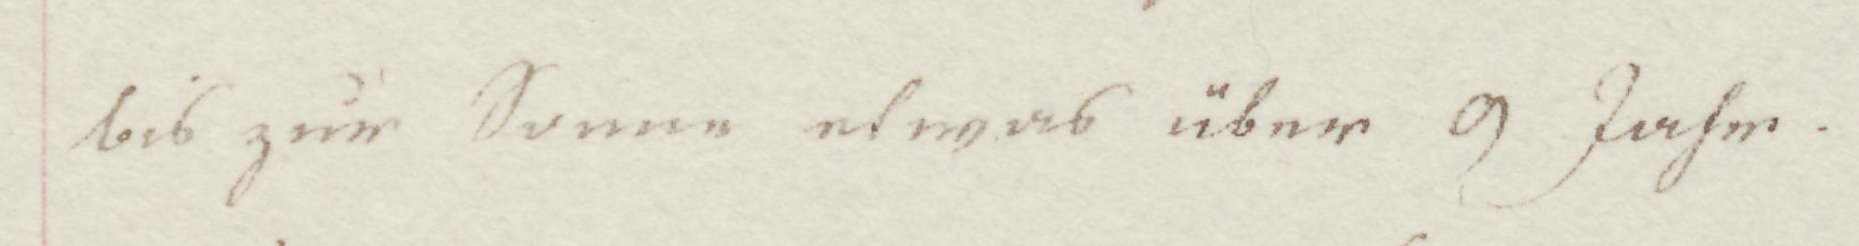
bis zur Sonne etwas über 9 Jahr.
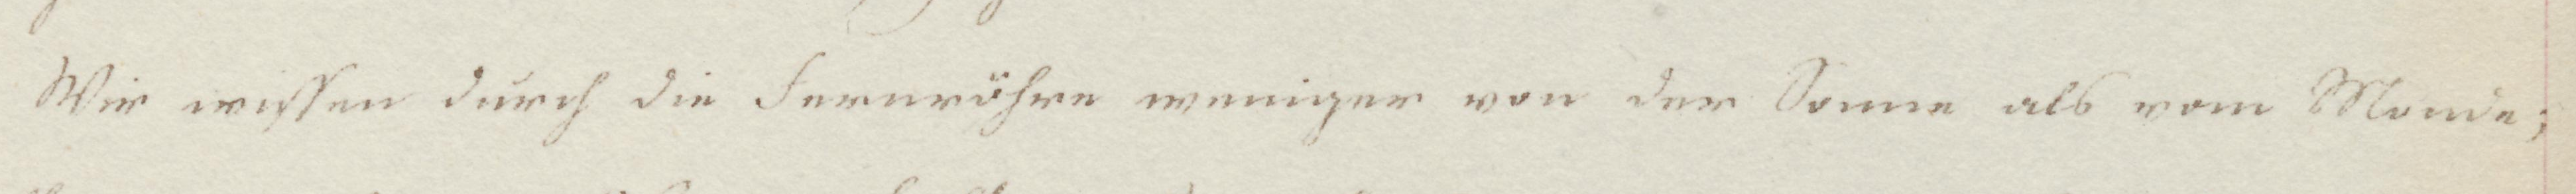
Wir wissen durch die Fernröhre weniger von der Sonne als vom Monde;
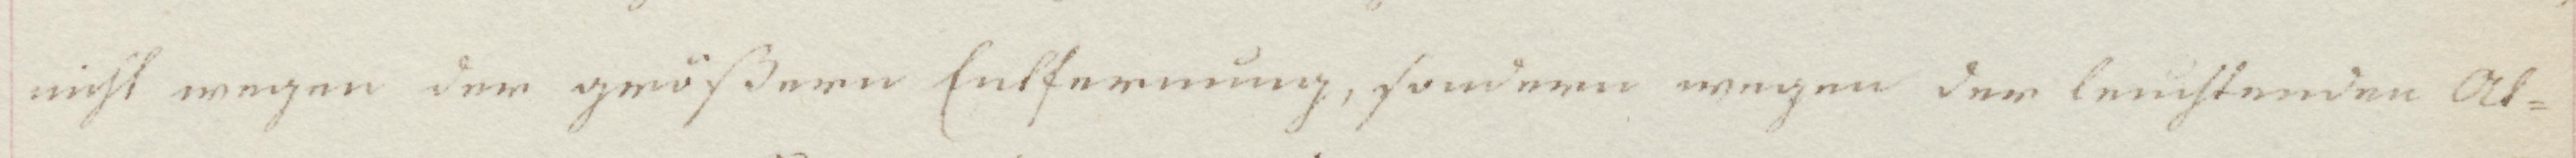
nicht wegen der größern Entfernung, sondern wegen der leuchtenden At-
